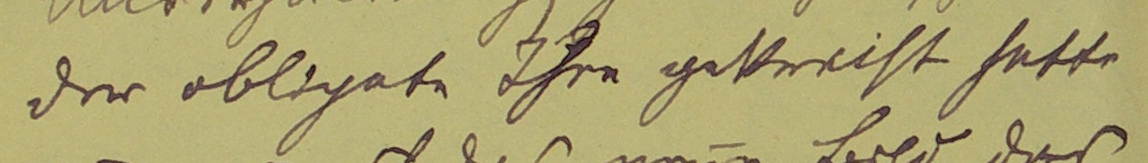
der obligate Thee gekreist hatte
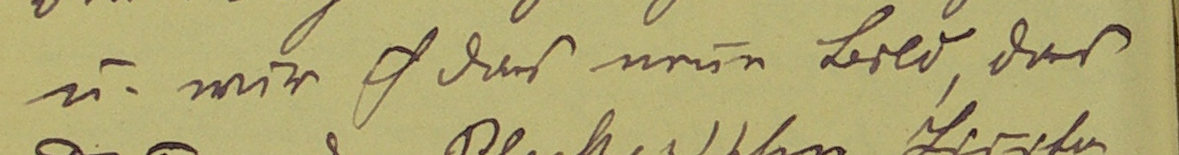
u. wir ch das neue Bild, das
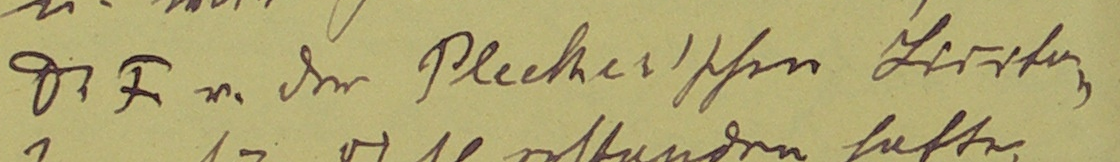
Dr. F. v. der ??? ???
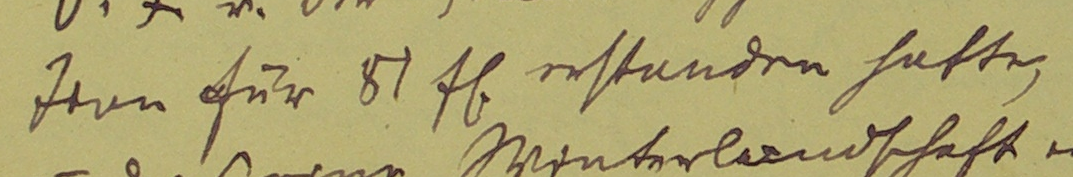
??? für 81 fl. erstanden hatte,
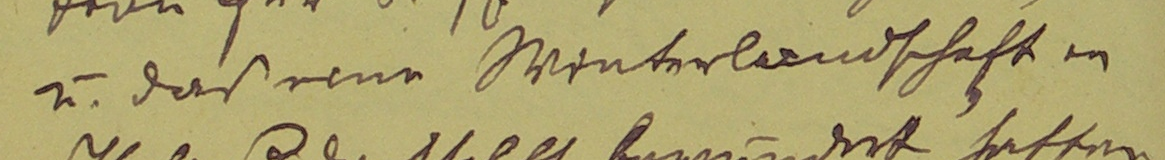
u. das eine Winterlandschaft in
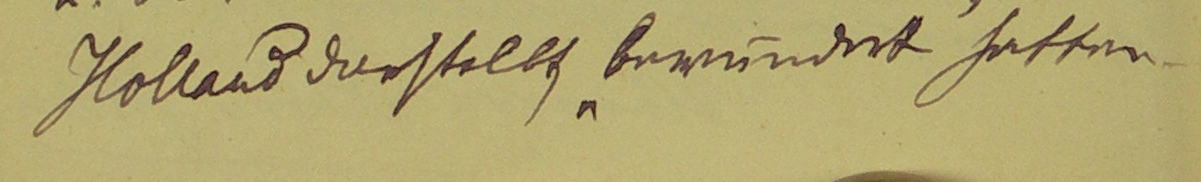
??? darstellt, bewundert hatten.
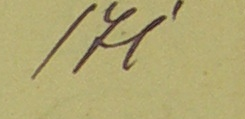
171
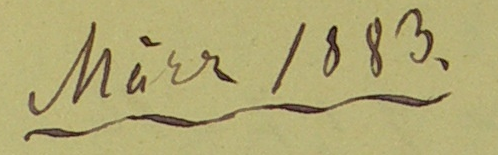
März 1883
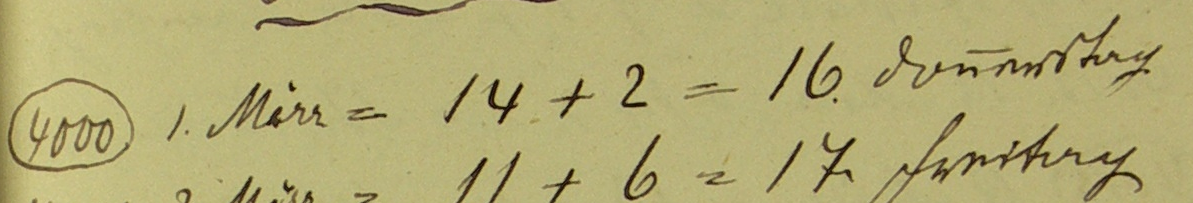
4000 1. März = 14 + 2 = 16. Donnerstag
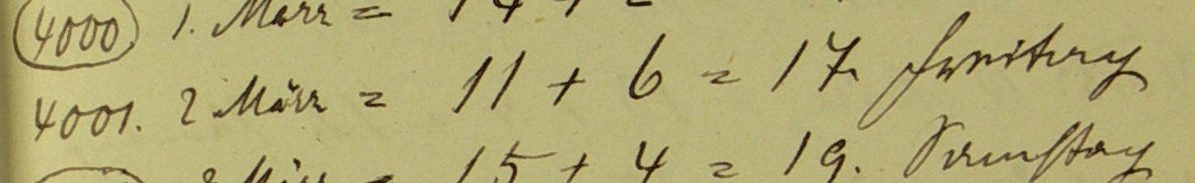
4001 2. März = 11+ 6 = 17. Freitag
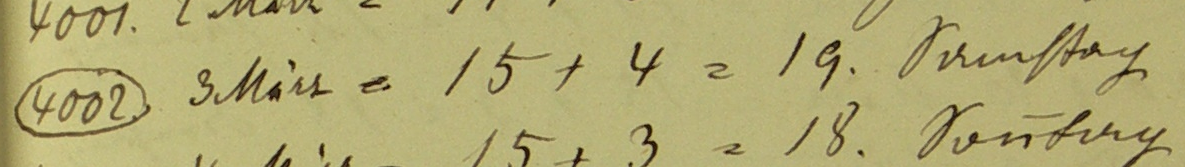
4002 3. März = 15 + 4 = 19. Samstag
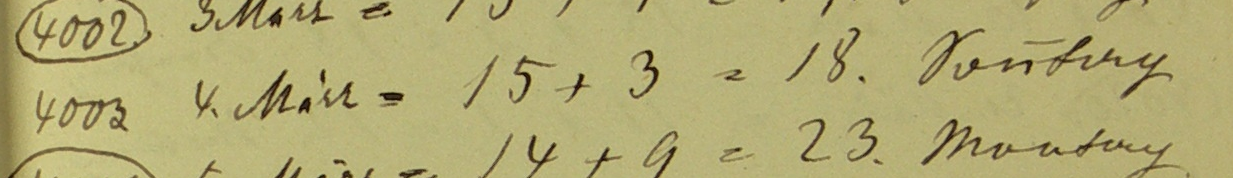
4003 4. März = 15 + 3 = 18. Sonntag
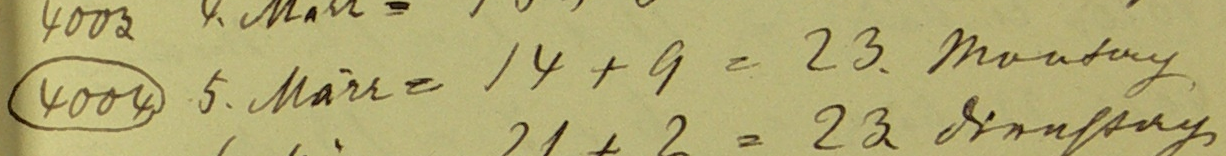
4004 5. März = 14 + 9 = 23. Montag
